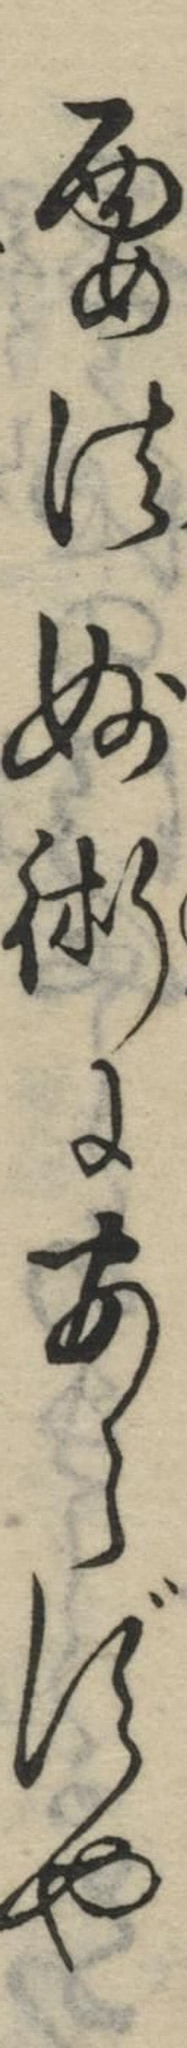要法妙術にあらずや
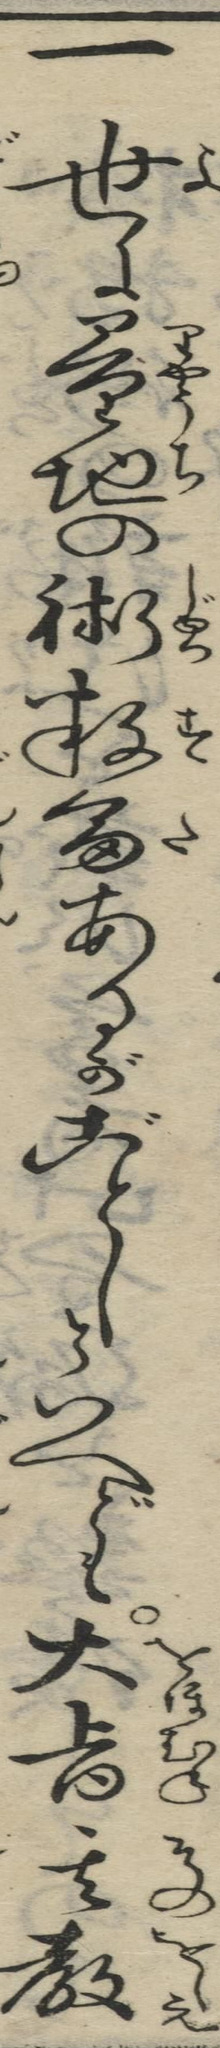一世に量地の術数多あるがごとしといへども。大旨其教
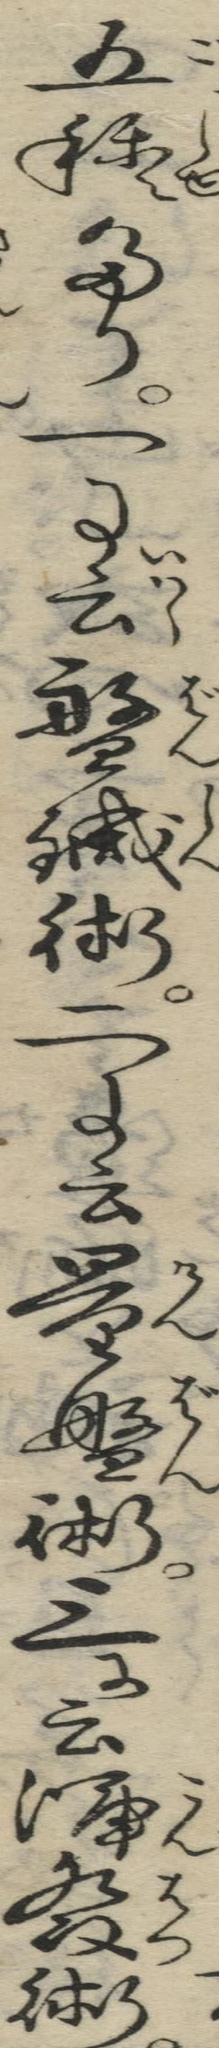五種たり。一に云盤針術。二に云量盤術。三に云渾発術。
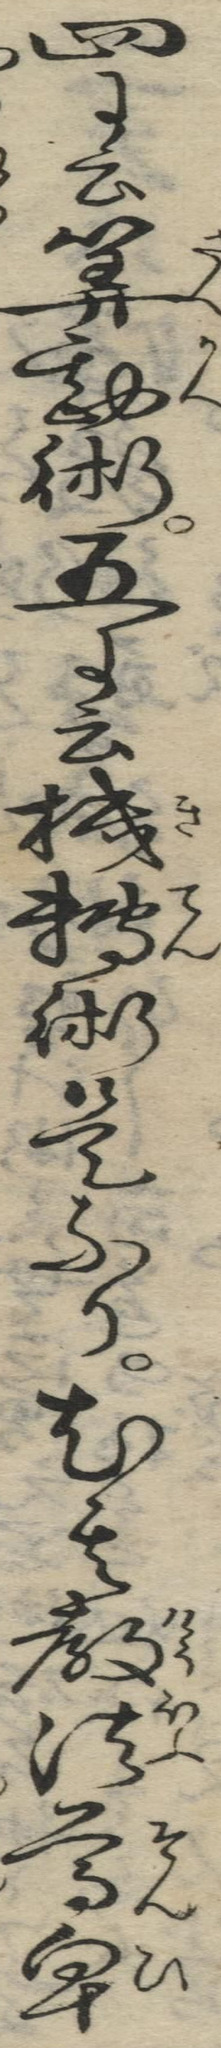四に云算勘術。五に云機転術是なり。尤其教法尊卑
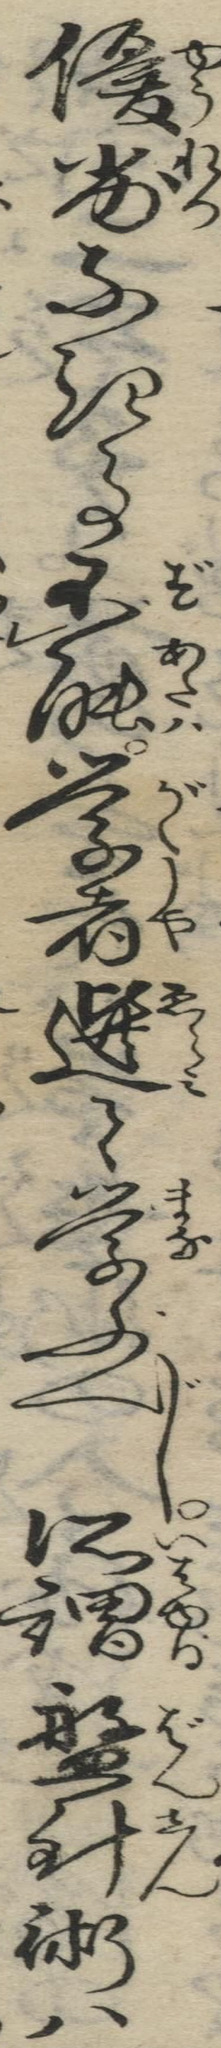優劣なき事不能。学者選て学ふべし。所謂盤針術は
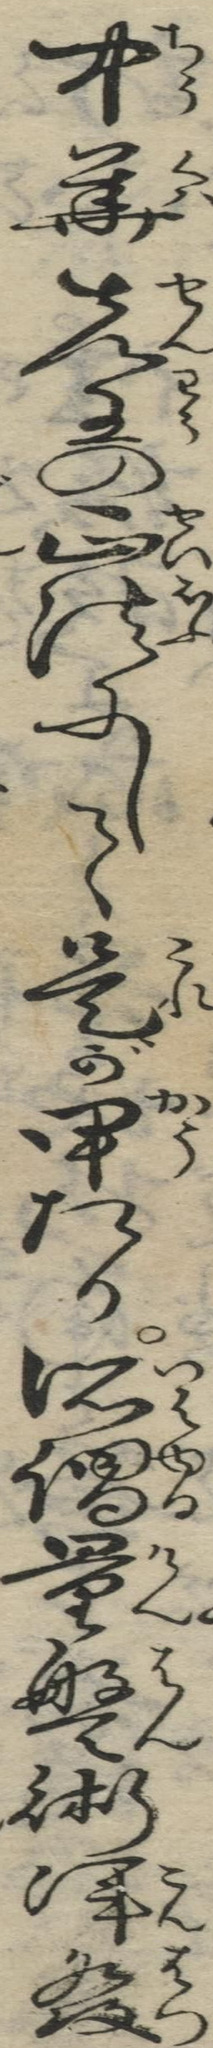中華先王の正法にして是が甲たり。所謂量盤術渾発
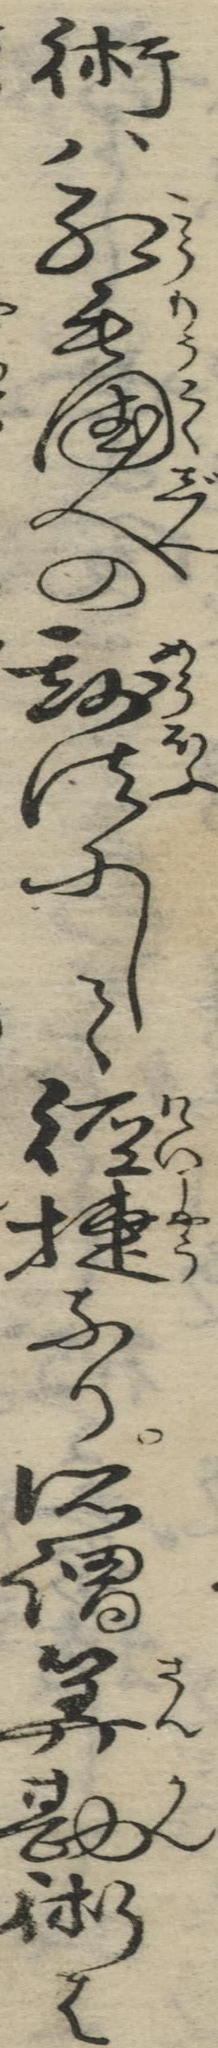術は紅毛国人の玅法にして径捷なり。所謂算勘
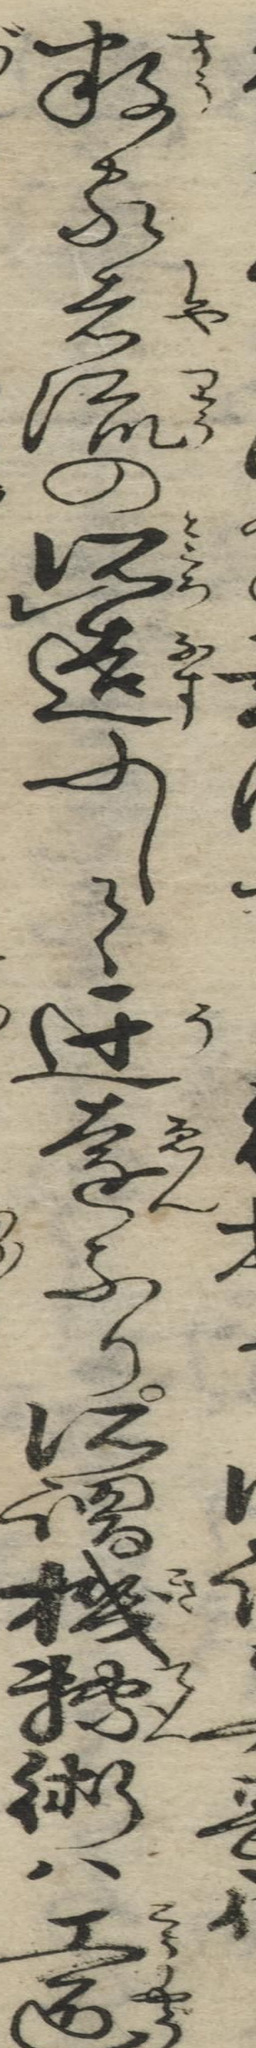数家者流の所遂にして迂遠なり。所謂機転術は工匠
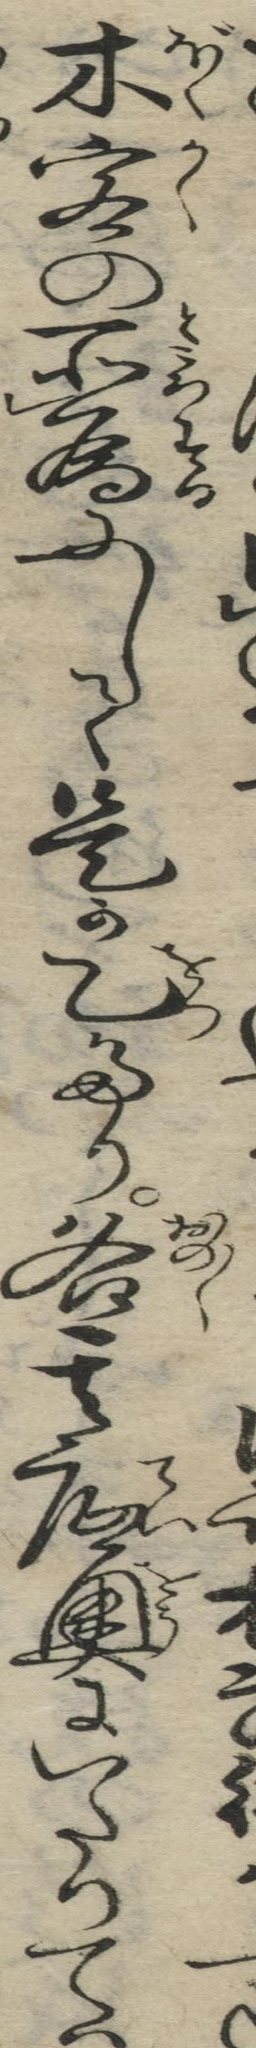木客の所為にして是か乙たり。各其底奥にいたりては
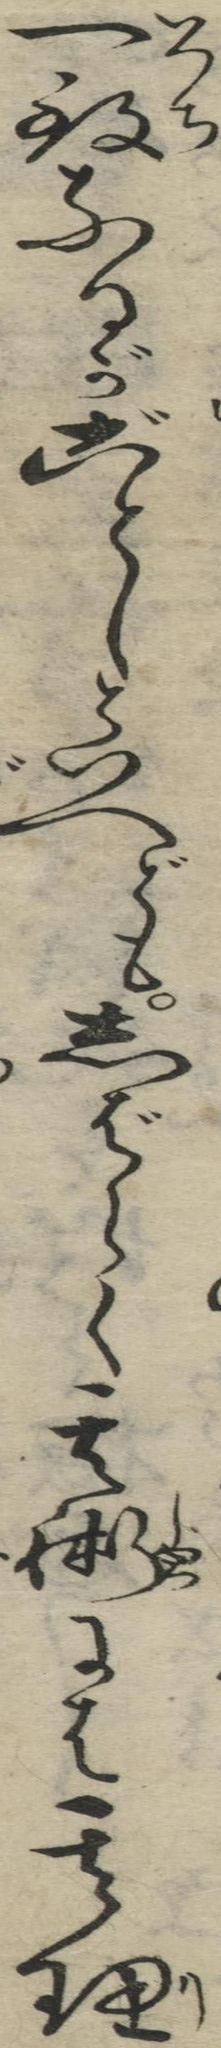一致なるがごとしといへども。しばらく其術には其理
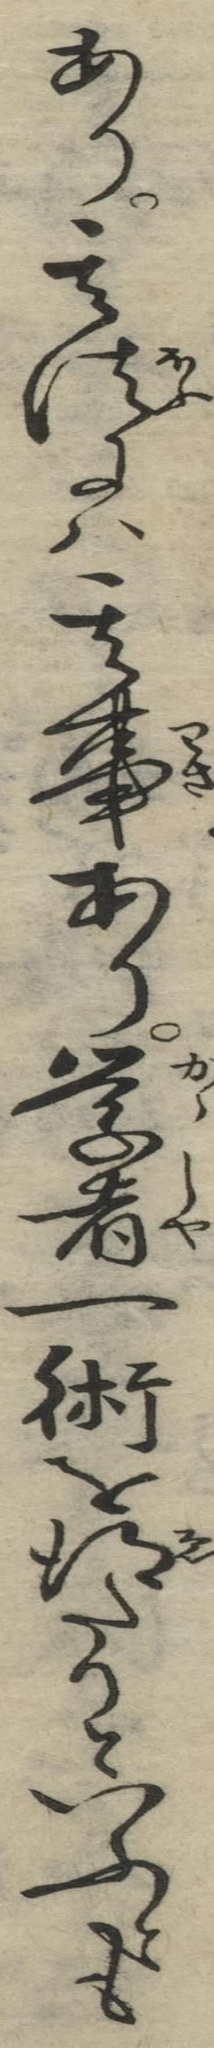あり。其法には其事あり。学者一術を得たりといふとも

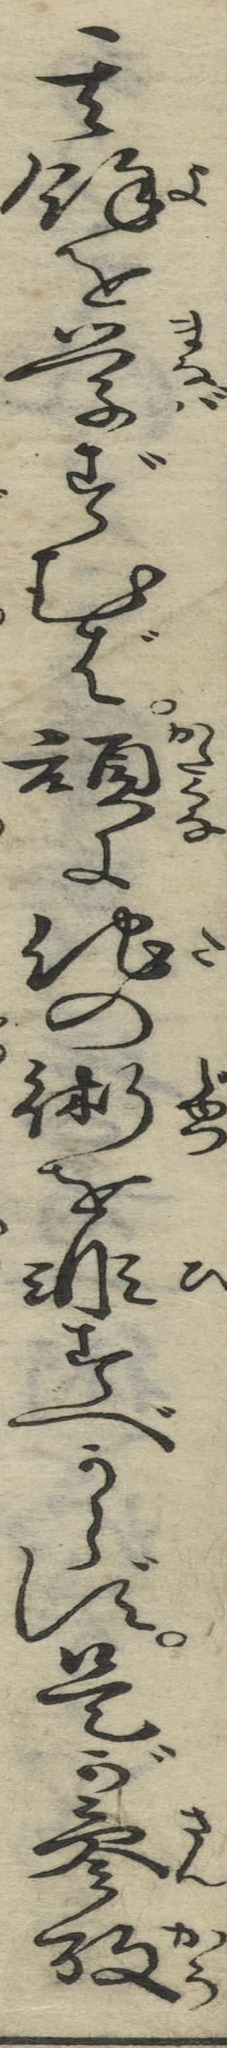其餘を学ずむば。頑に他の術を非すべからず。是が参攷
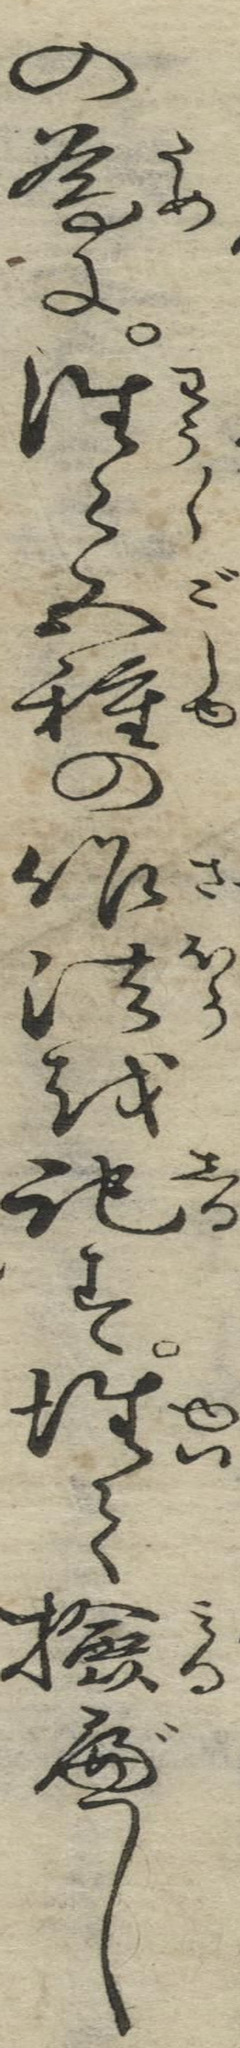の為に。往〻五種の作法を記す。惟て検べし
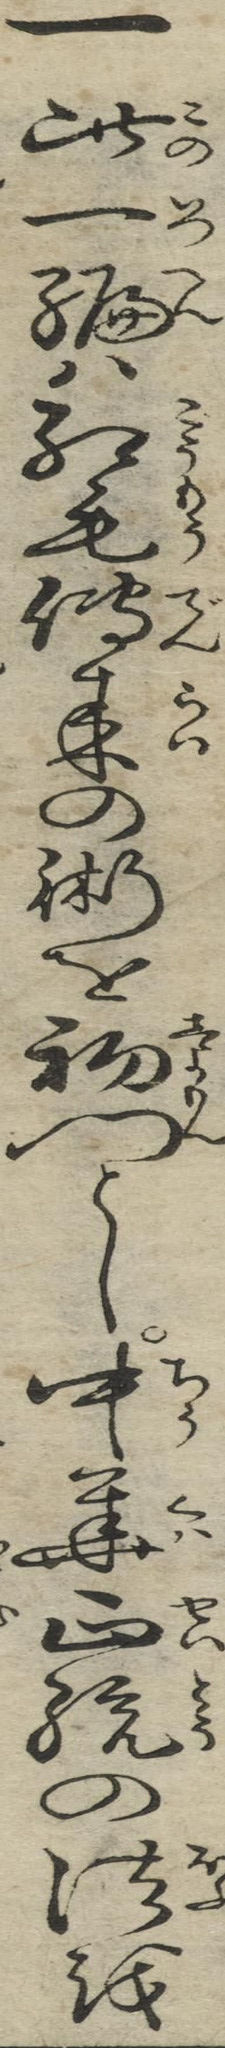一此一編は紅毛伝来の術を初門とし。中華正統の法を
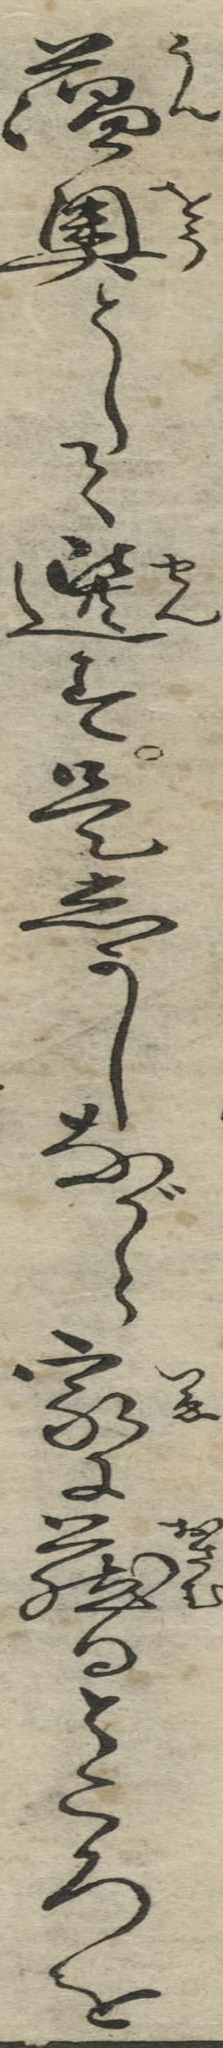蘊奥として選す。是しかしながら家に蔵るところを
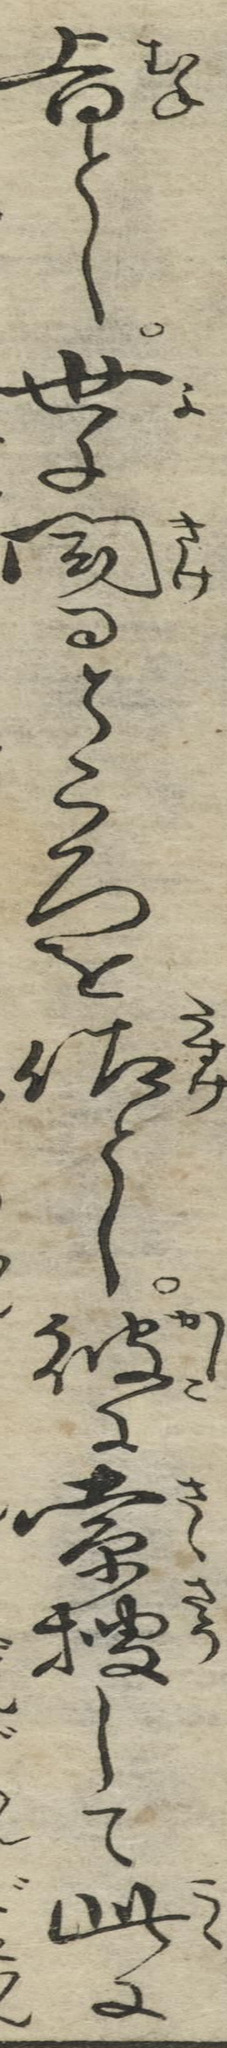旨とし。世に聞るところを佐とし。彼に索捜して此に
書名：量地指南　巻之一（内題）
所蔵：東京大学地震研究所図書室 Earthquake Research Institute Library, The University of Tokyo, JAPAN
